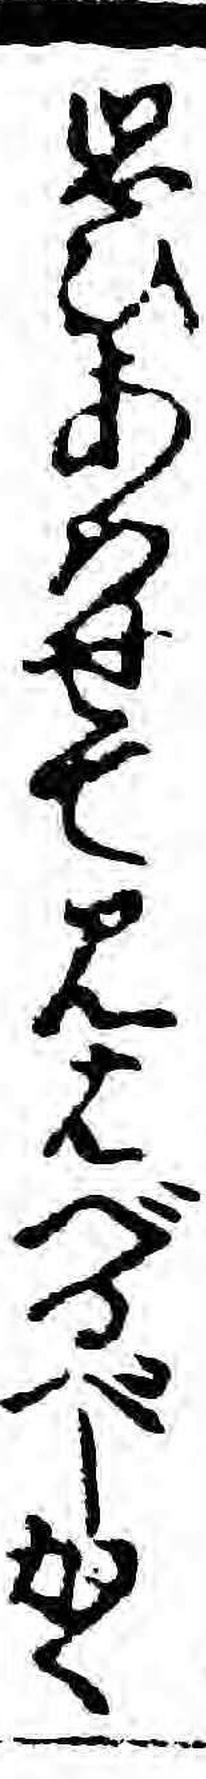思ひあはせて見はべるべしかく
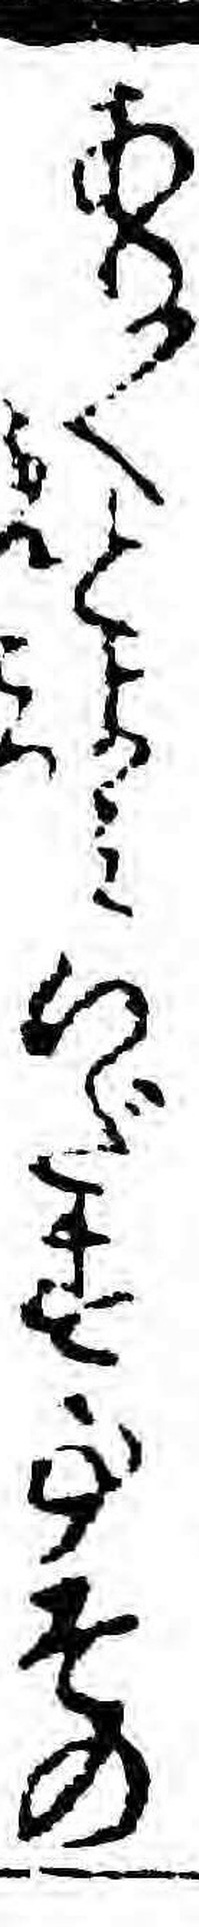あり〳〵とよみいだす事その
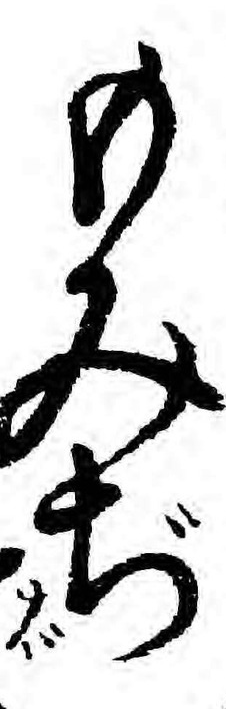もみぢ
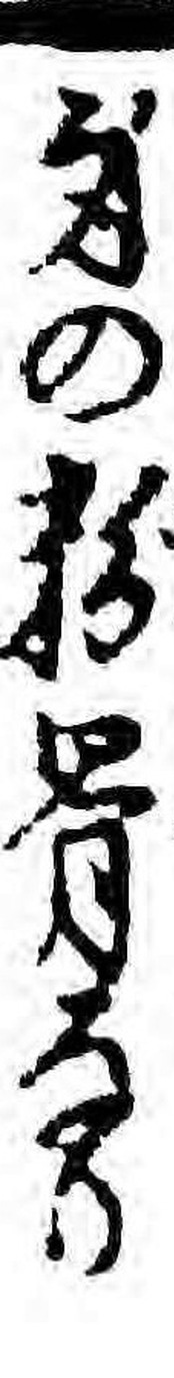身の粉骨なり
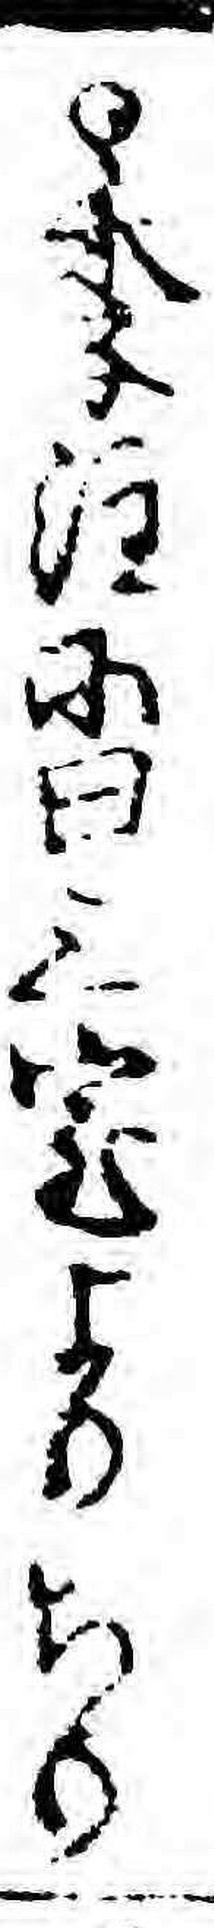〇季注に曰三室よりちり
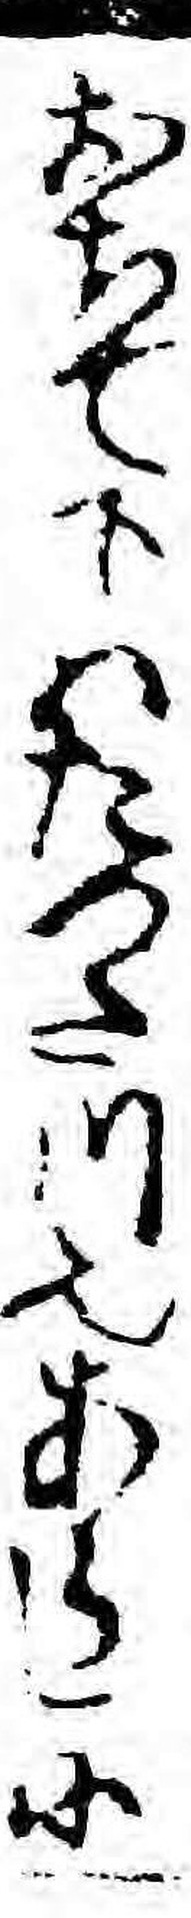おちて下はたつた川也あらしに
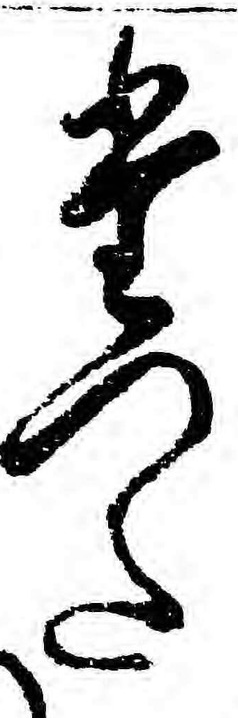たつた
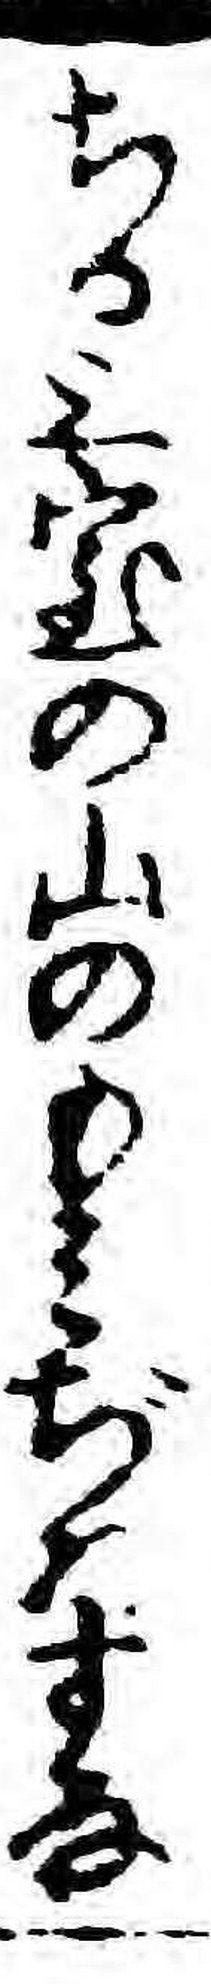ちる三室の山のもみぢはすな
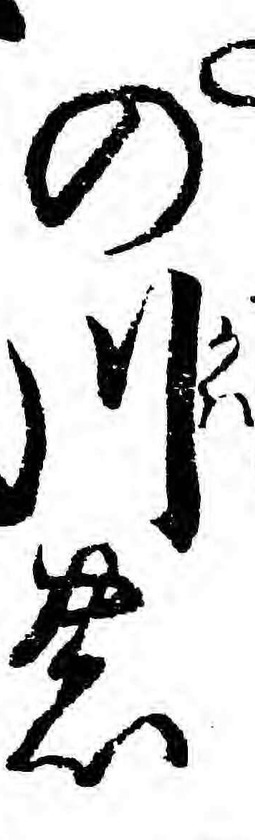の川の
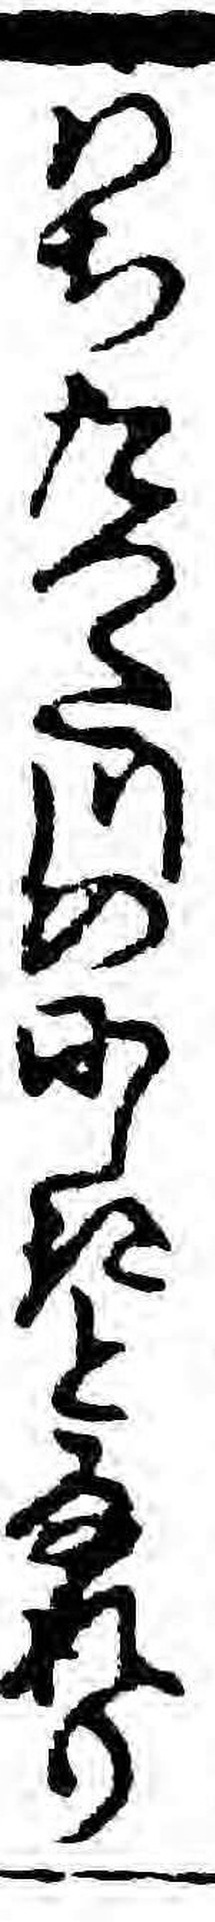はちたつた川のにしきとなれり
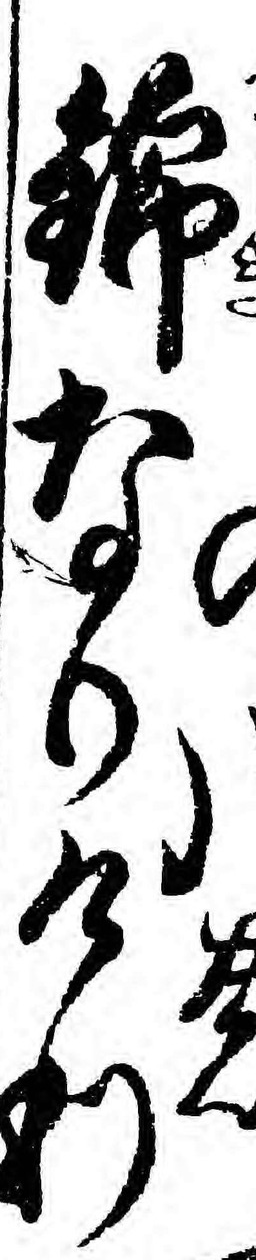錦なりけり

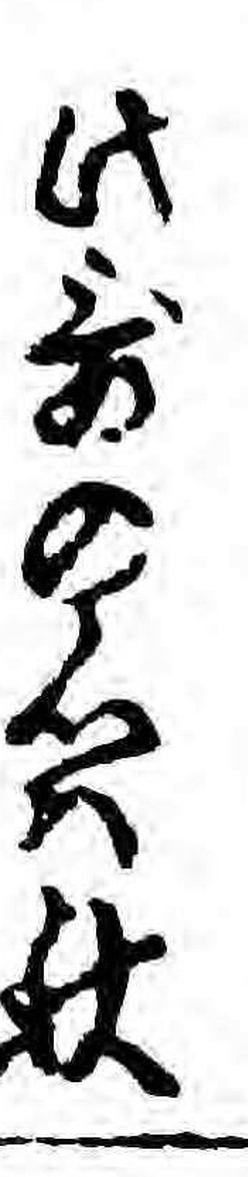此哥の心は秋
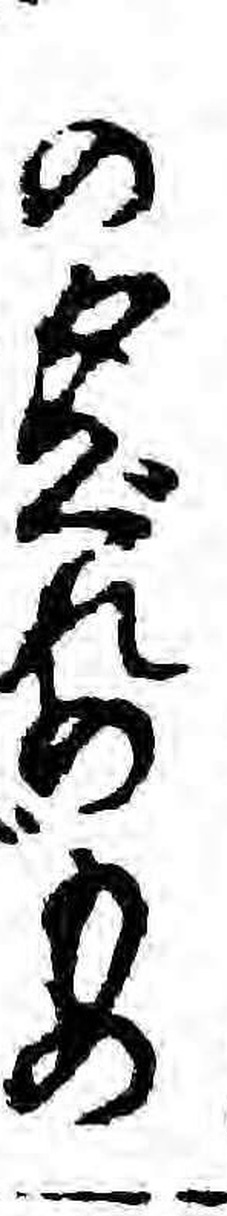の夕ぐれのもの
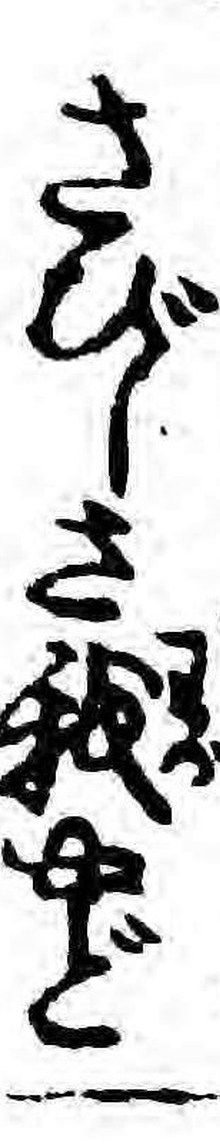さびしさ我やど
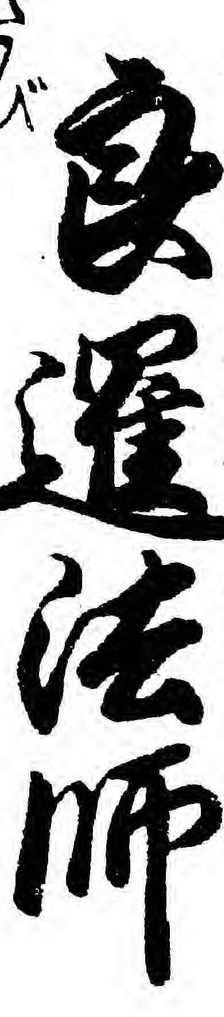良暹法師
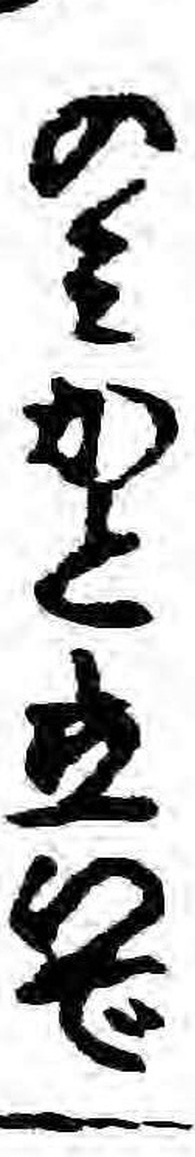のみかと立いで
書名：頭書和歌注譯／壽賀多百人一首小倉錦
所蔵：国文学研究資料館
